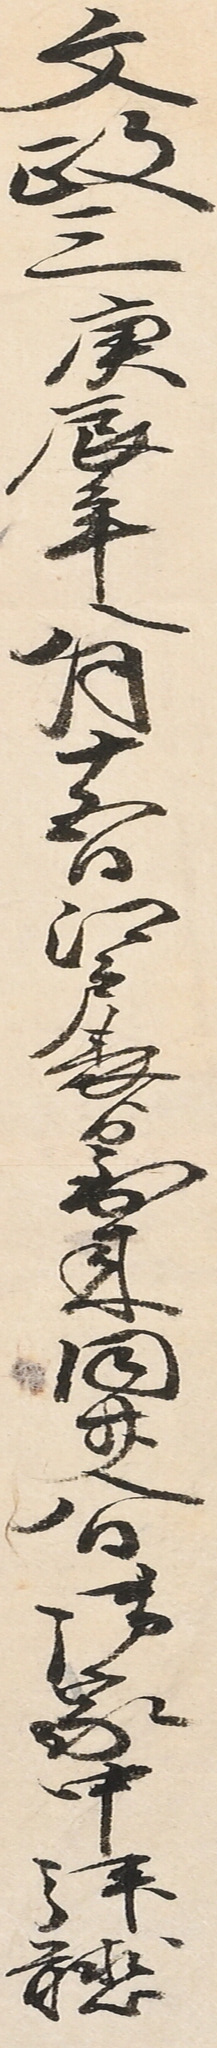文政三庚辰年八月十五日江戸表より到来同廿八日御家中拝聴
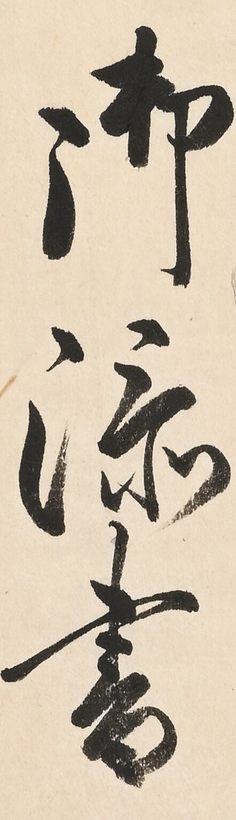御添書

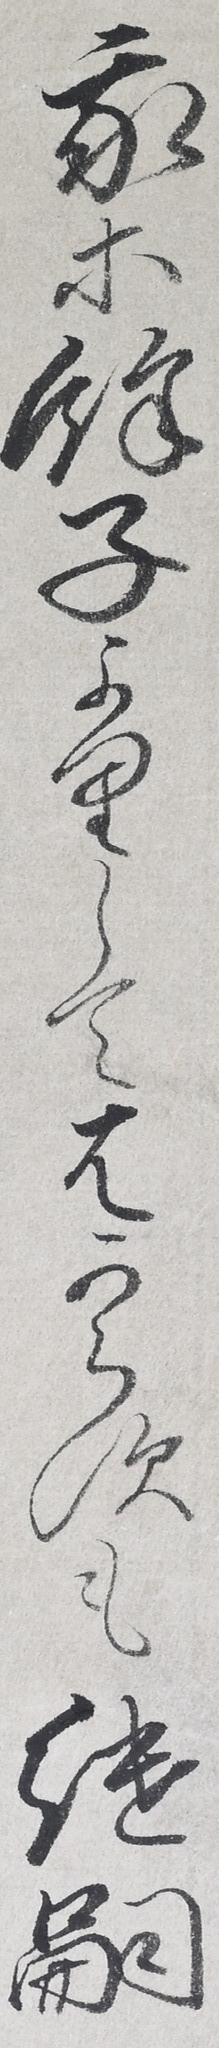我等余子よりしてはからすも継嗣
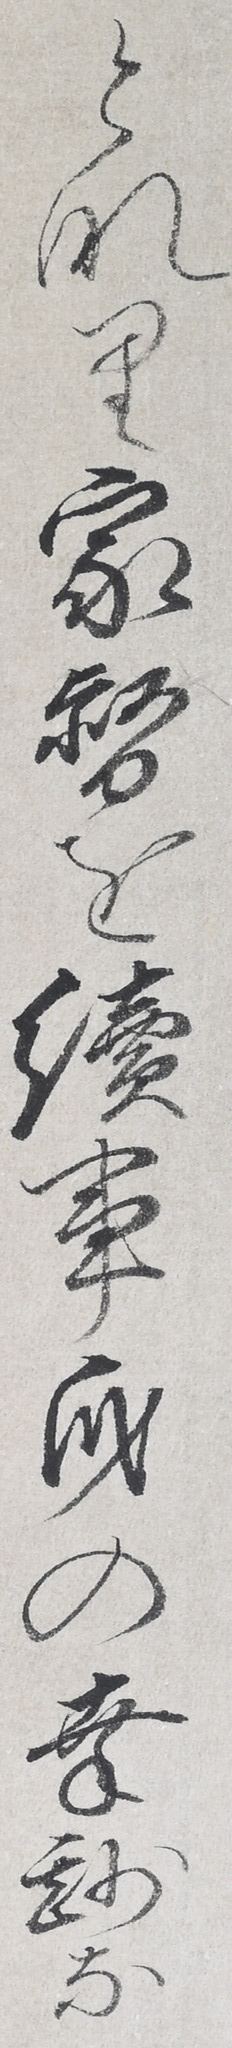となり家督を続事身の幸尠な
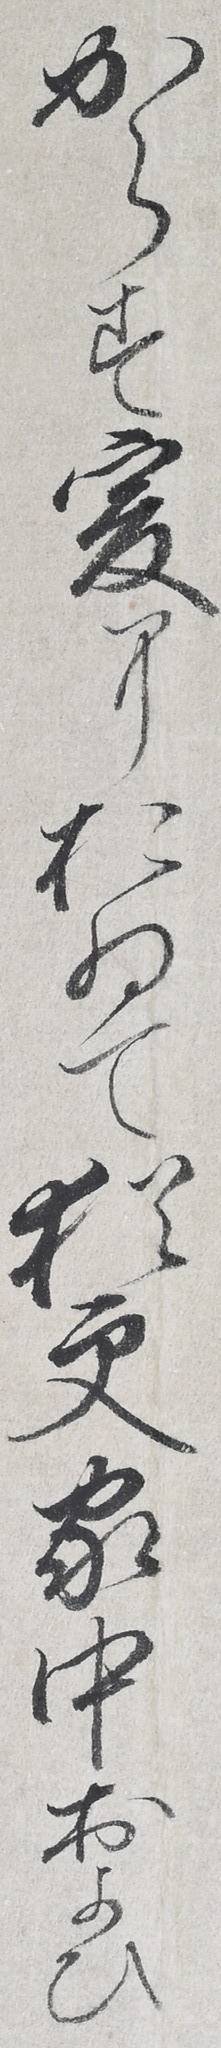からす爰におゐて猶更家中およひ
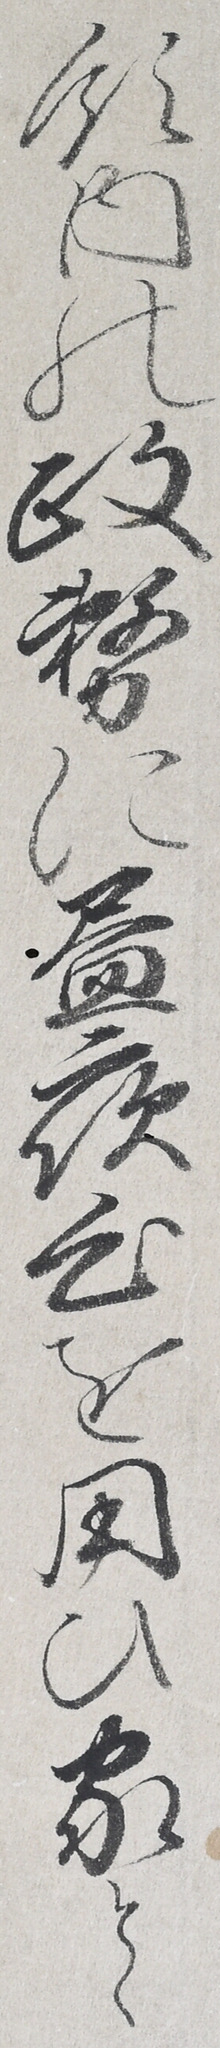領内の政務に昼夜心を用ひ家とく
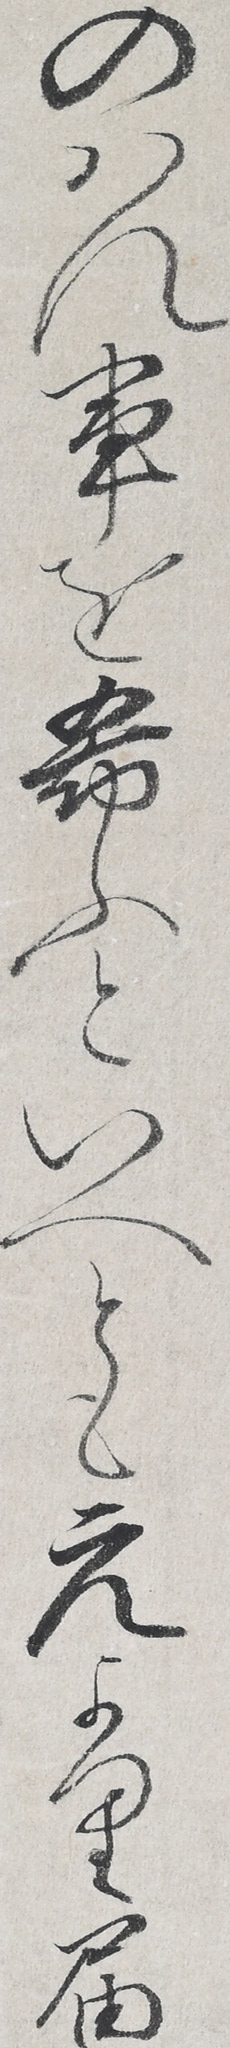のはん事を希ふといへとも元より届
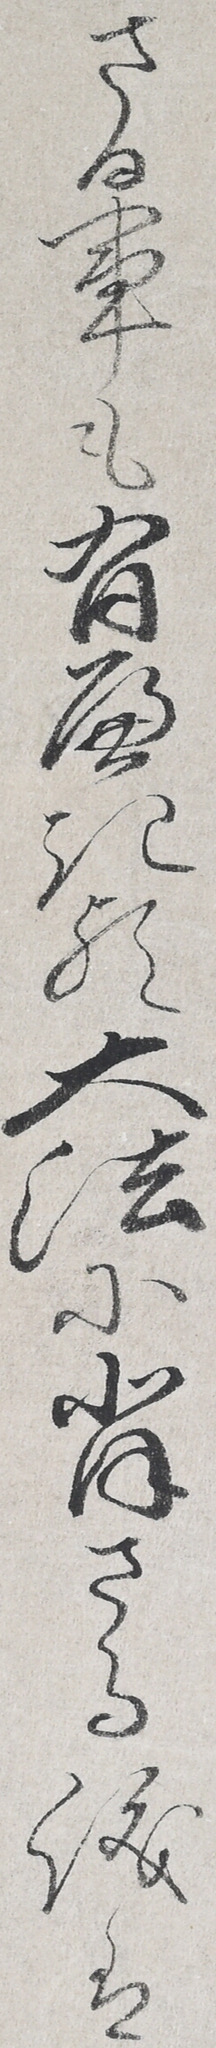さる事も有へき歟大法に背さる儀は
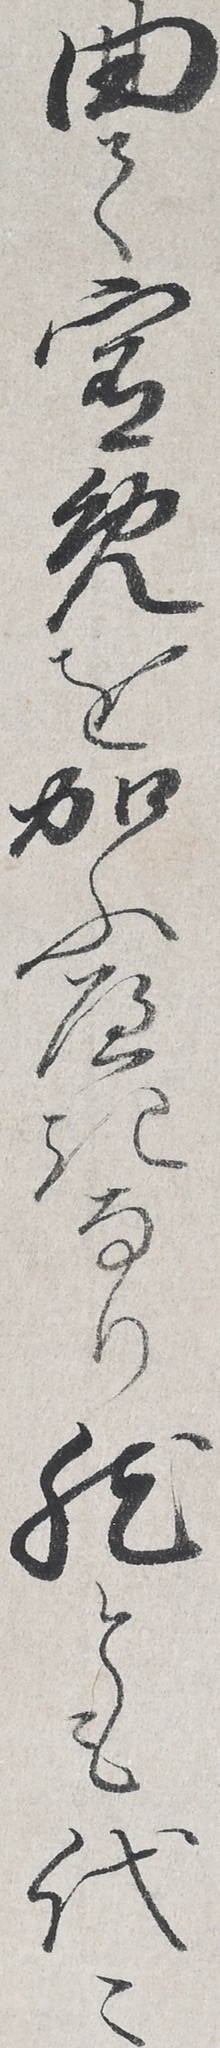曲て宥免を加ふへきなり然とも代々
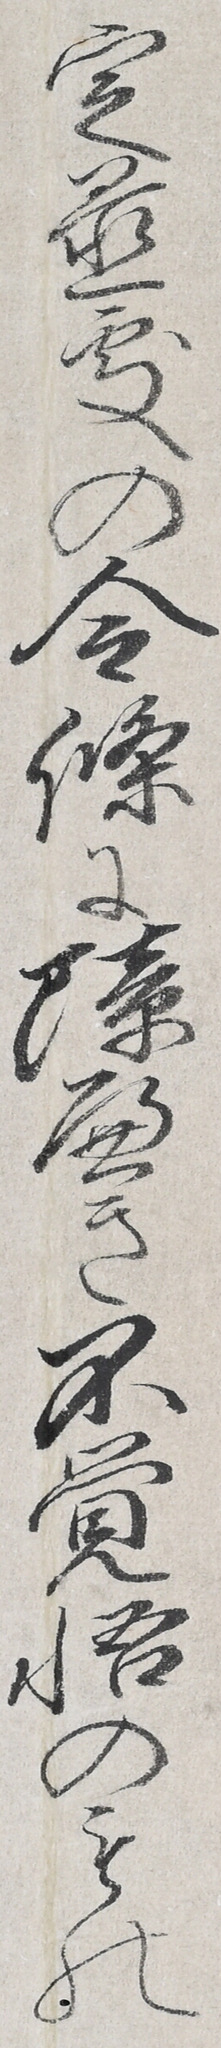定置処の令條に障へき不覚悟のもの
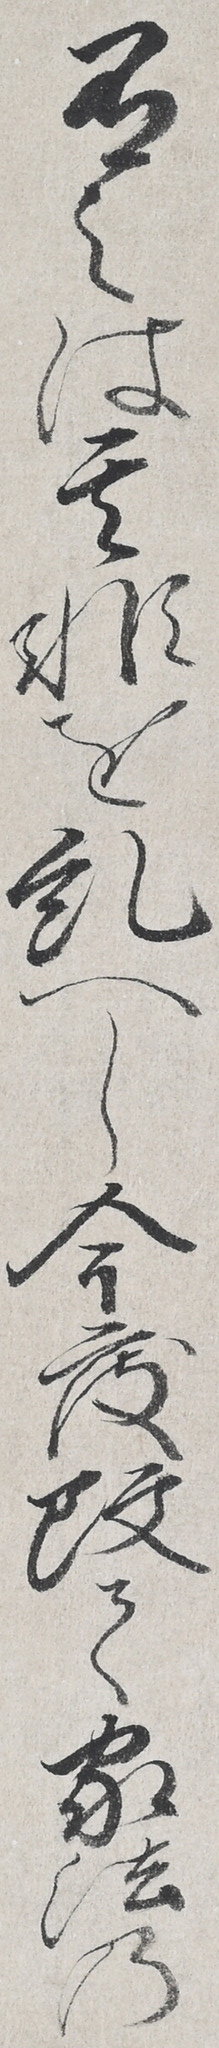有之は其非を糺へし今度改て家法の
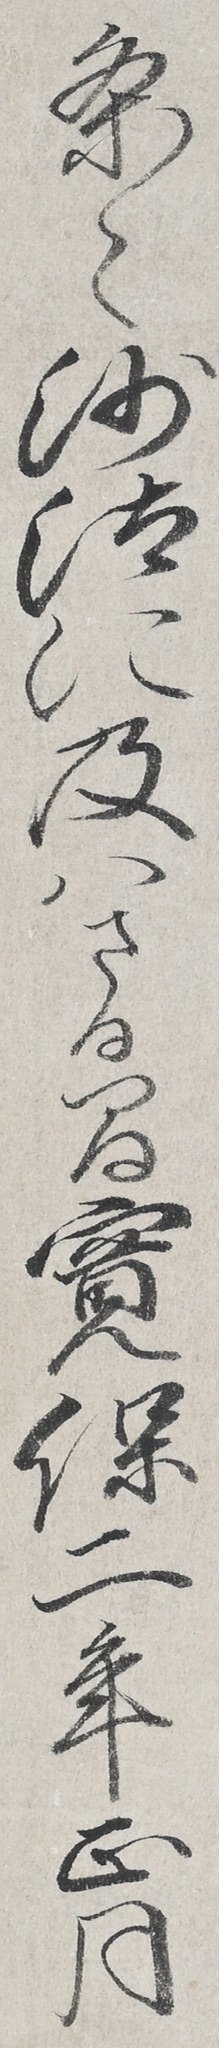条々沙汰に及はさる間寛保二年正月
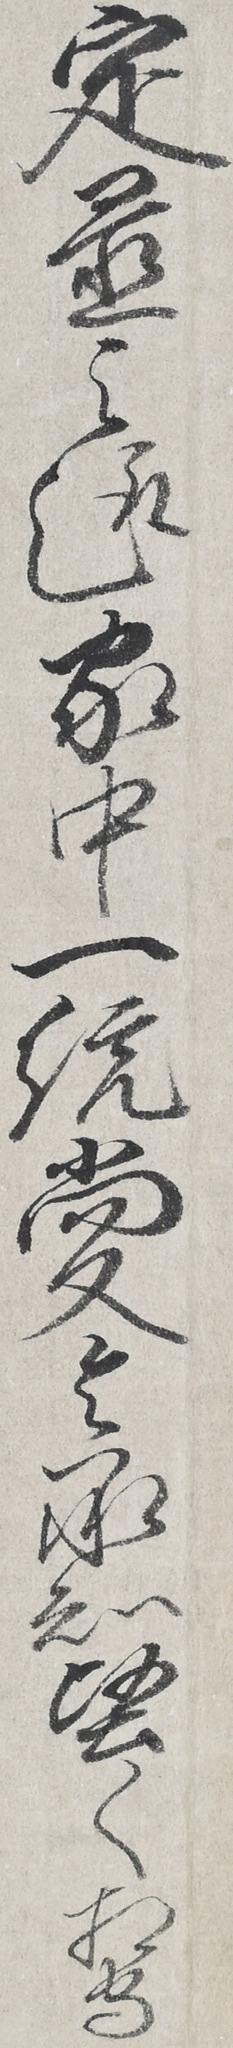定置之趣家中一統尚又其承知堅く相守
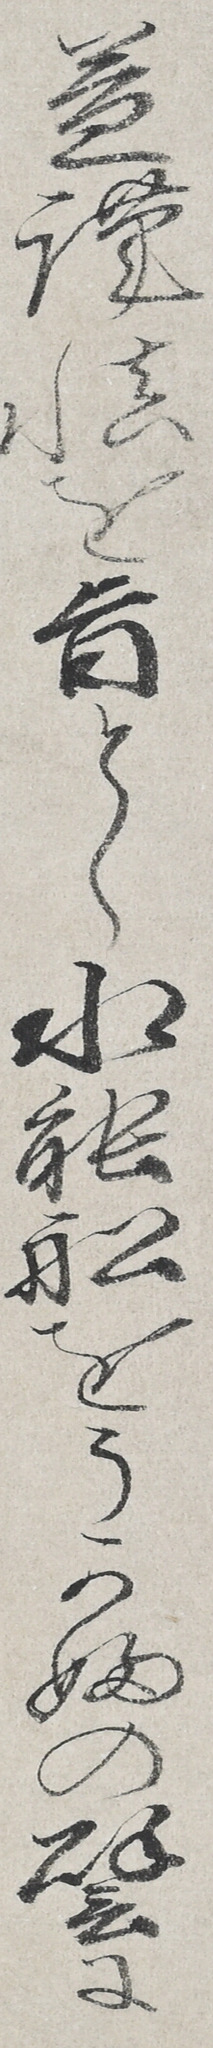益謹慎を旨とし水能船をうかへの譬に
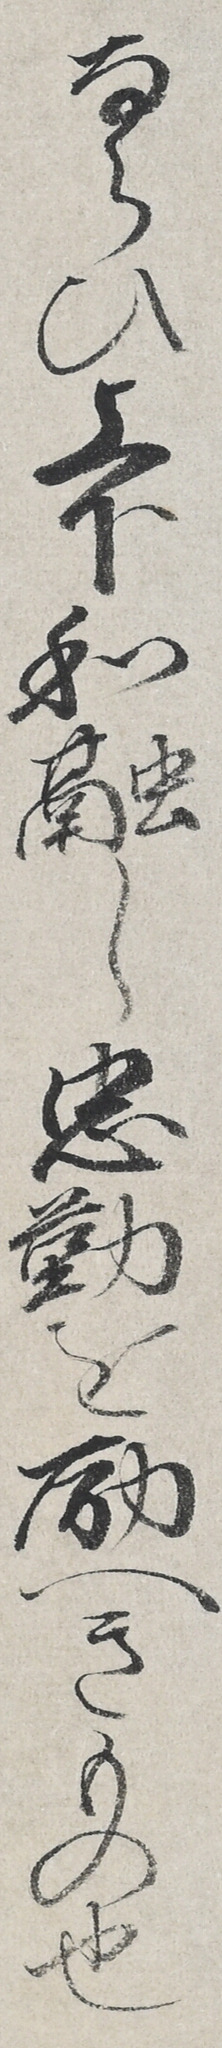ならひ上下和融し忠勤を励へきもの也
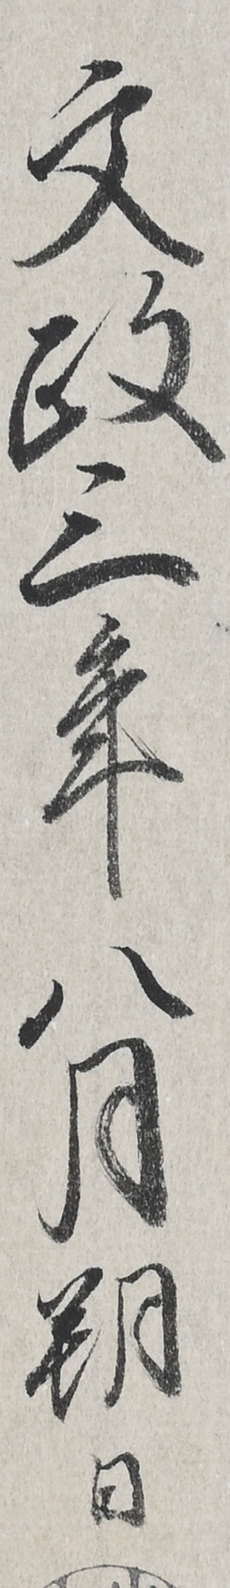文政三年八月朔日
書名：添書
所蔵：伊那市立高遠町図書館・合同会社AMANE
